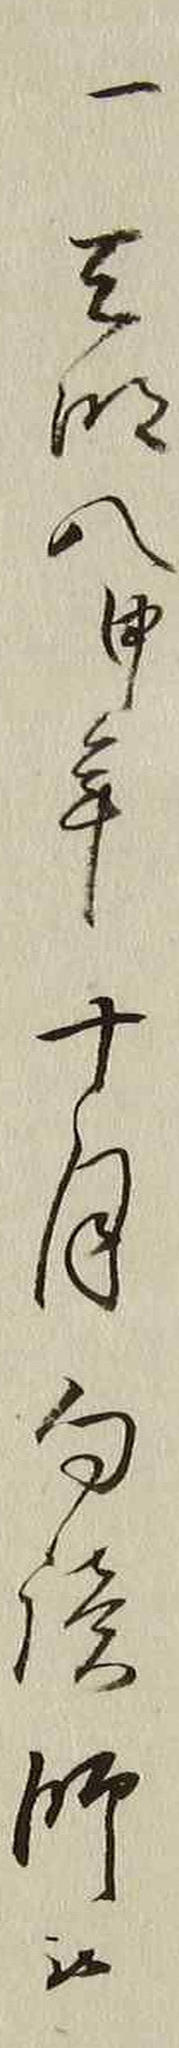一天明八申年十月句読師被
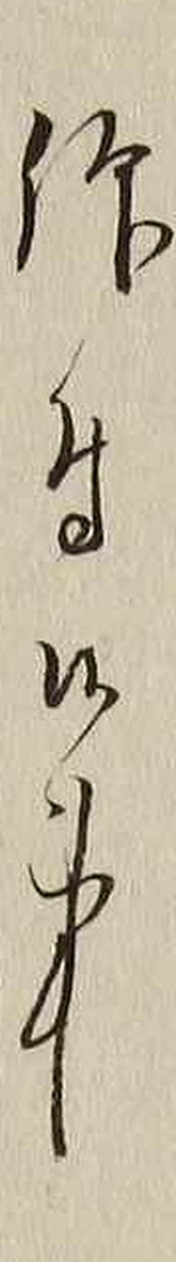仰付候事
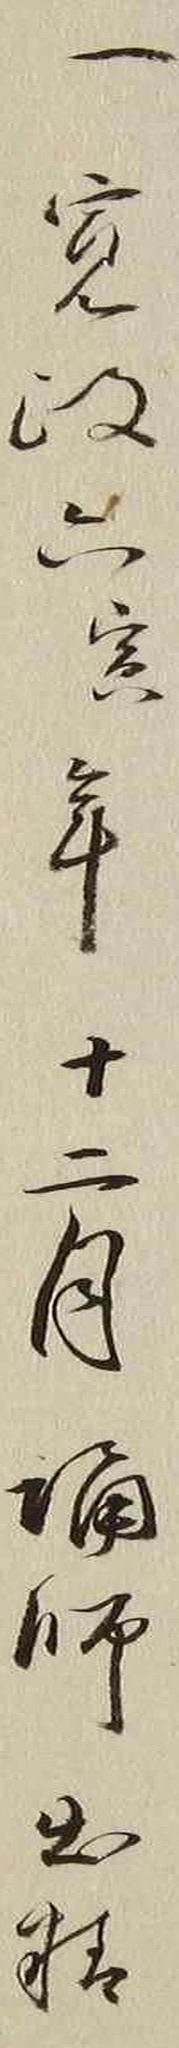一寛政六寅年十二月誦師出精
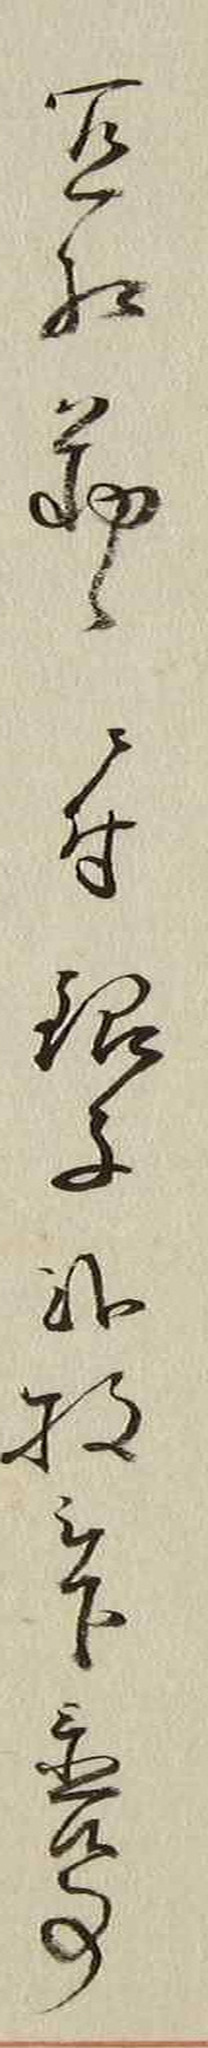宜相勤候ニ付銀子弐枚被下置候事
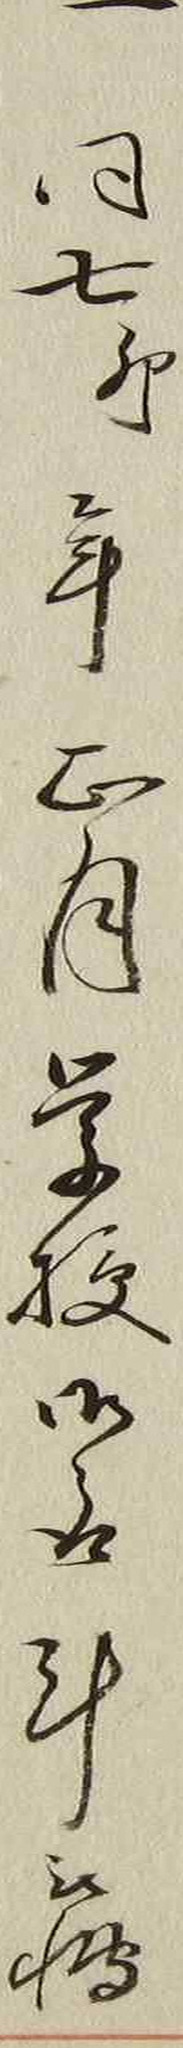一同七卯年正月学校御取計被転
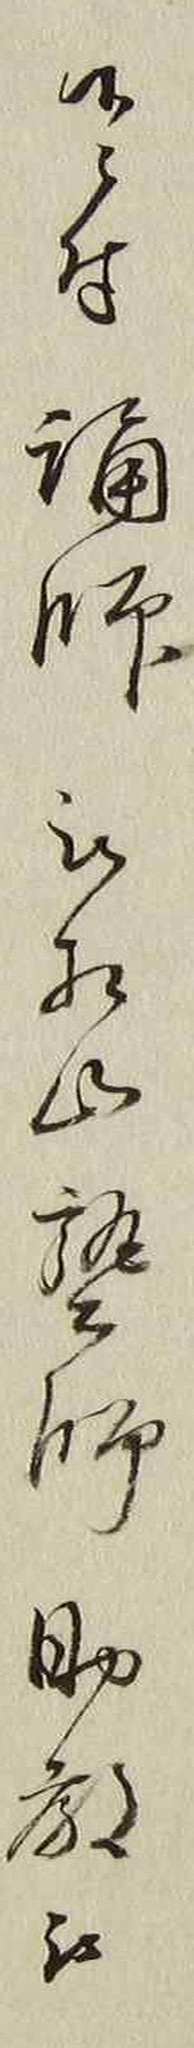候ニ付誦師被相止塾師助教被
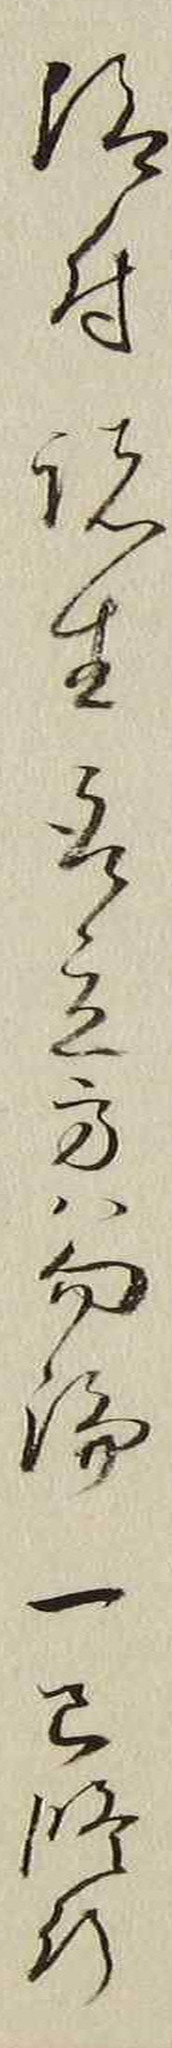仰付諸生取立方ハ勿論一己修行
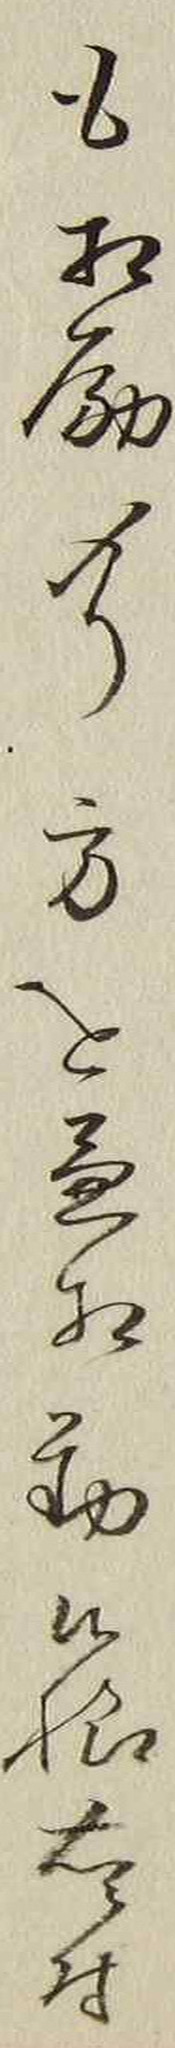も相励〆り方を兼相勤候様右ニ付
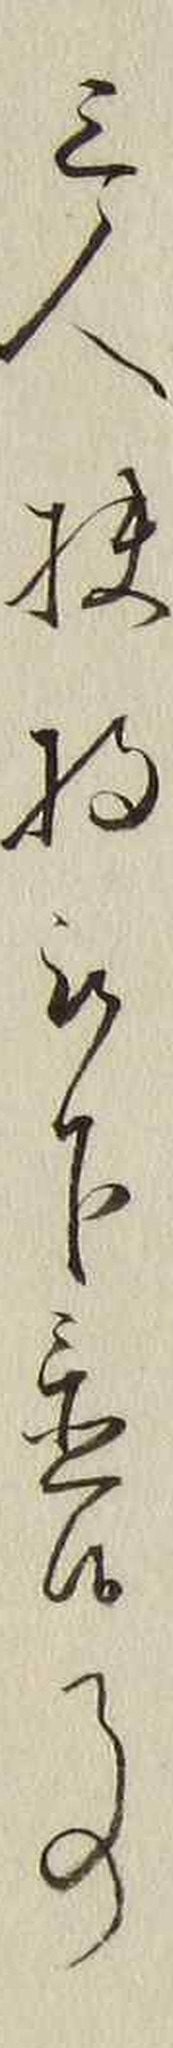三人扶持被下置候事
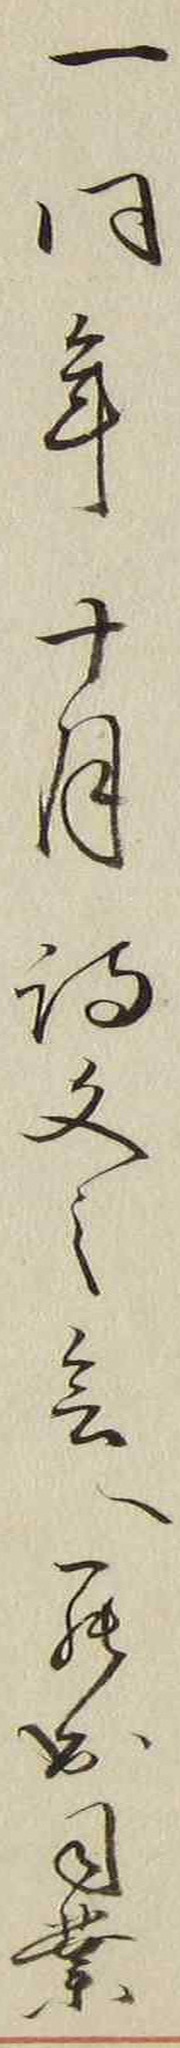一同年十月詩文之会へ罷出司業

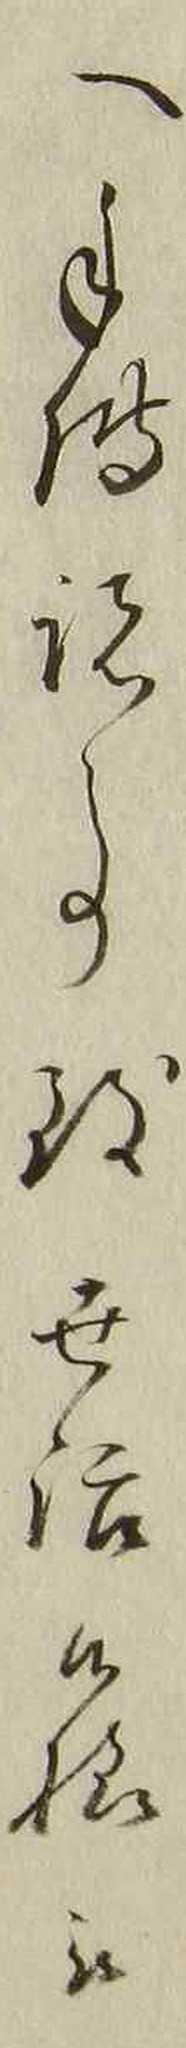へ手伝諸事致世詰候様被
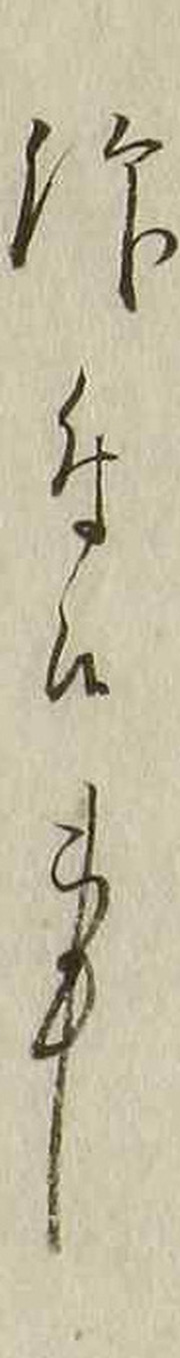仰付候事
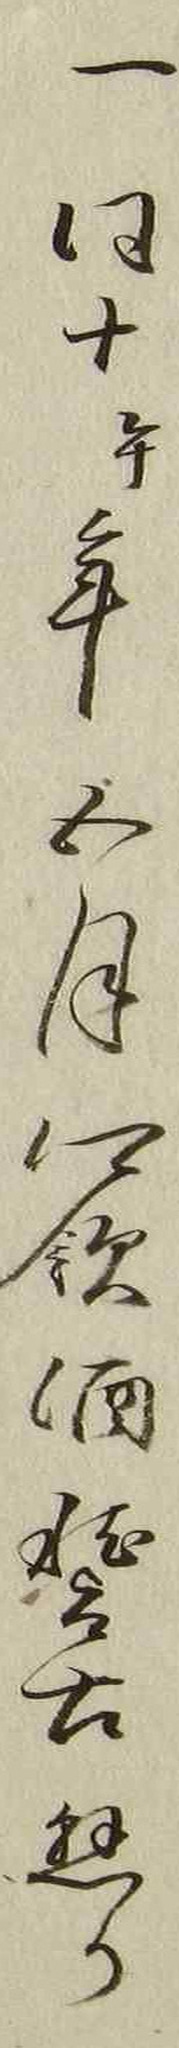一同十午年五月郷飲酒稽古懸り
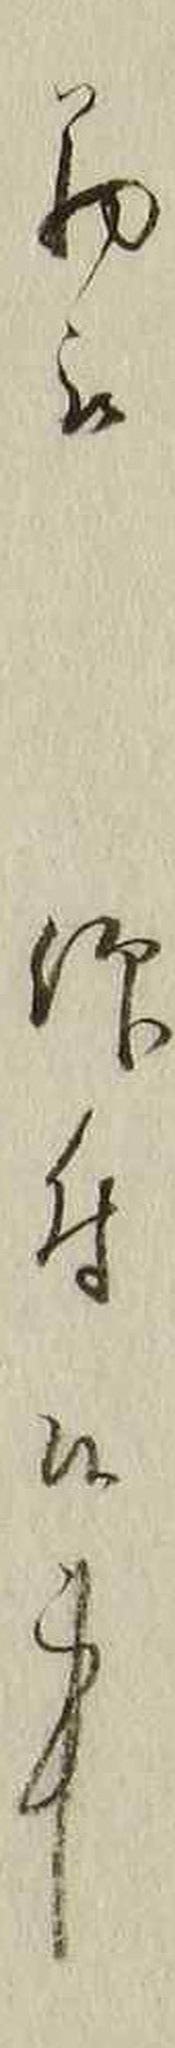勤被仰付候事
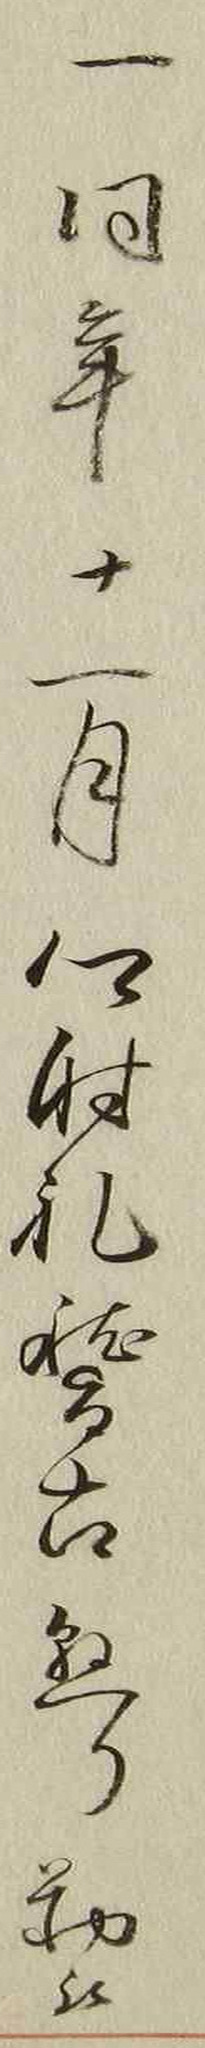一同年十一月郷射礼稽古懸り勤被
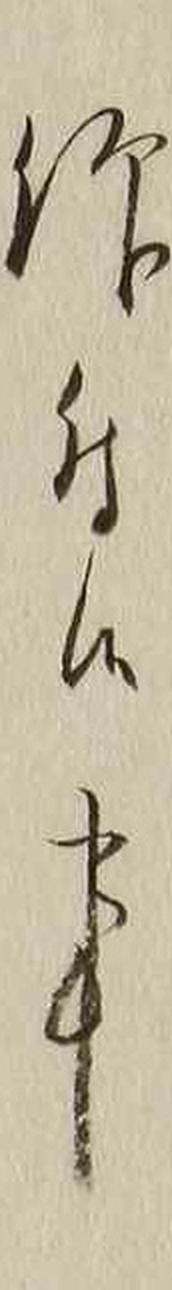仰付候事
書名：諸士系譜　巻之28　い之部28
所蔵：会津若松市立会津図書館
